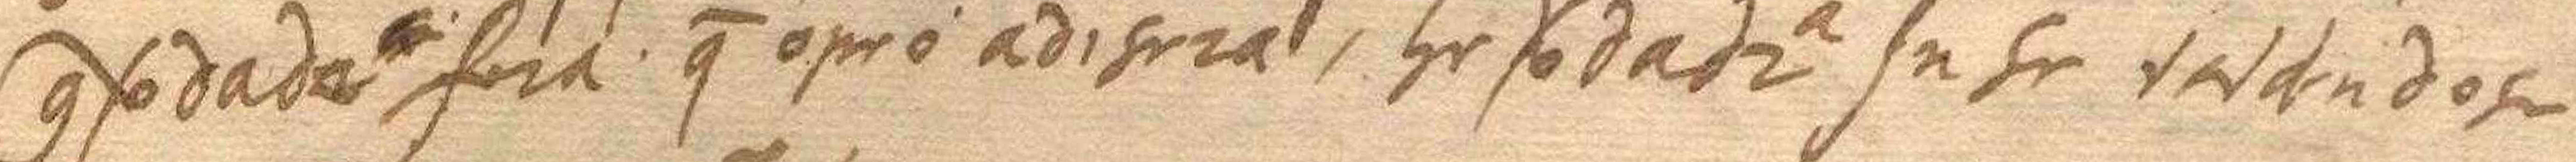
q̄ ꝟdade_ fora. q̄ o reo a disera / he ꝟdadra Jn Se ētēdendose
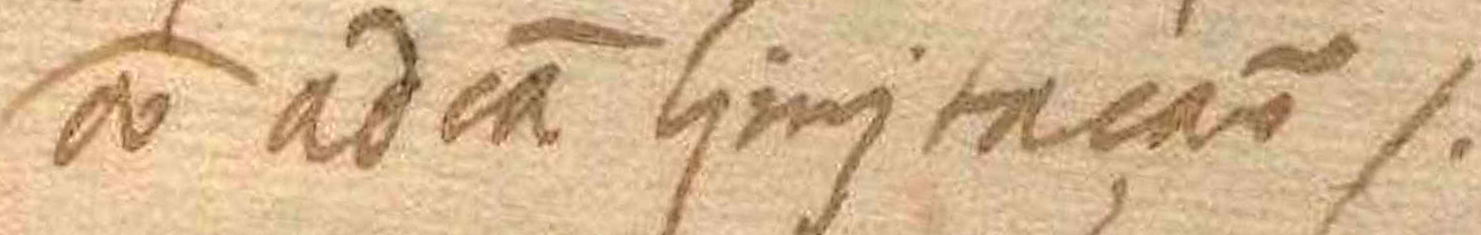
c̄o a dcā ljmjtação /.
